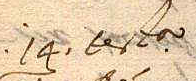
14. test.a
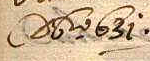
Dbr.o 631.
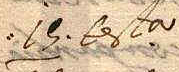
15. test.a
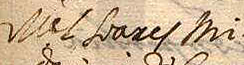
M.el soares mi
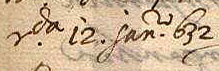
r.da 12. jan.ro 632.
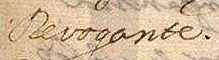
Revogante.
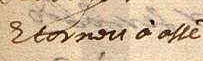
E tornou a assē
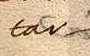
tar -
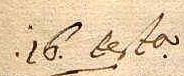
.i6. test.a
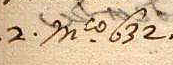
2. m.co 632.
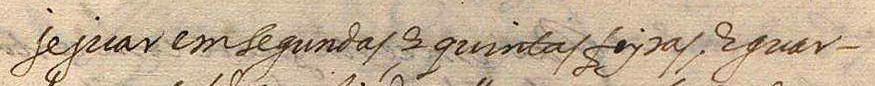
jejuar em segundas, E quintas feyras, E guar
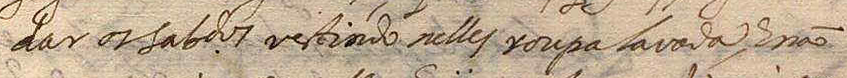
dar os sab.dos vestindo nelles roupa lavada, E naõ
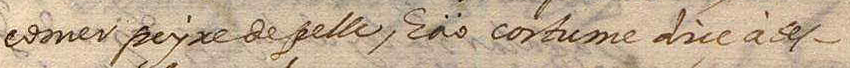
comer peyxe de pelle, E ao costume dice a tes
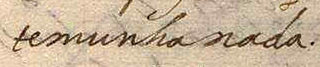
temunha nada.
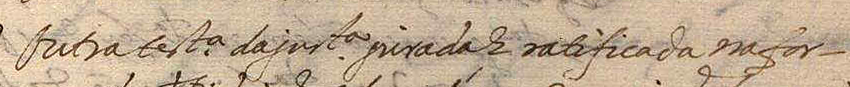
Outra test.a da just.a jurada, E ratificada na for
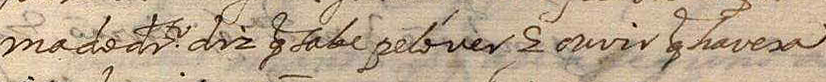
ma do d̄r.to diz q̄ sabe pelo uer, E ouvir q̄ havera
